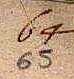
64
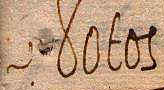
Votos
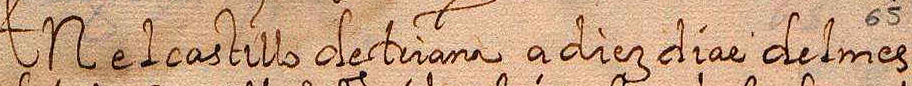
En el castillo de triana a diez dias del mes
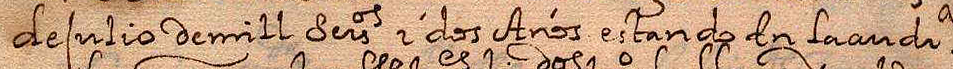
de Julio de mill seisos i dos An̄os estando en la audia
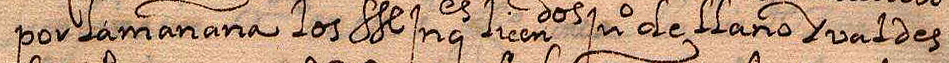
por la mañana los os SSs Jnqes licendos Juo de llan̄o Y valdes
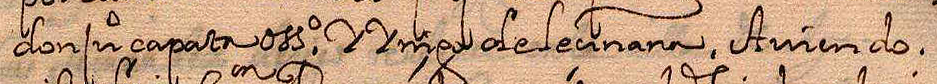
don Juo çapata oss.o Y Ynigo de Leciñana, Auiendo
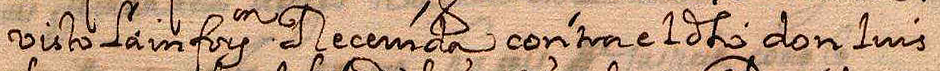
visto la inforson Receuida contra el dho don luis
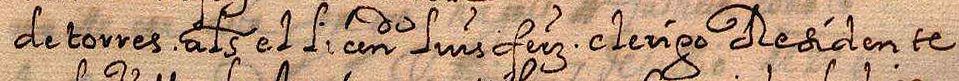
de torres āls el licendo luis fer̄z clerigo Residente
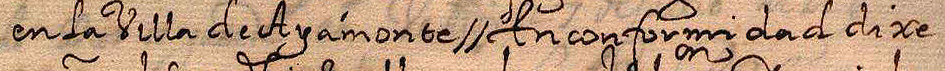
en la Villa de Ayamonte // En conformidad dixe
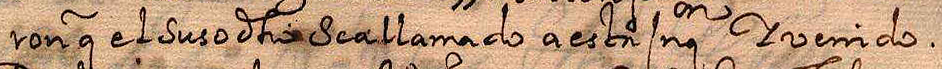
ron q̄ el susodho sea llamado a esta Jnqon Y venido
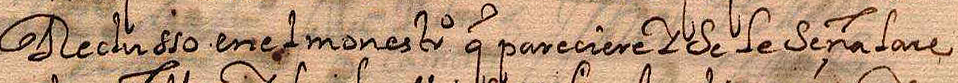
Reclusso en el monestro q̄ pareciere Y se le señalare
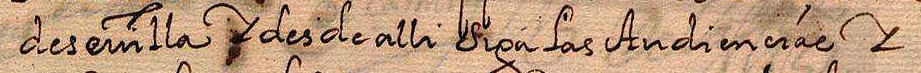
de seuilla Y desde alli siga las Audienciae Y
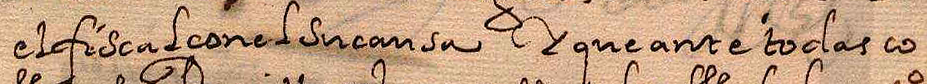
el fiscal con el su causa Y que ante todas co
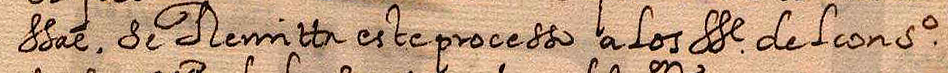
ssas se Remitta este processo a los SSs. del conso.
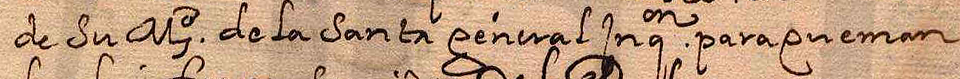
de Su Md. de la Santa General Jnqon. para que man
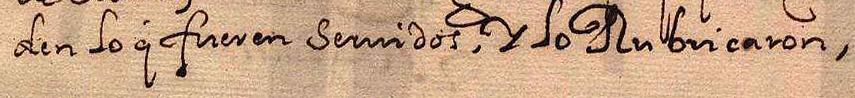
den lo q̄ fueren seruidos. Y lo Rubricaron,
